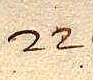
22
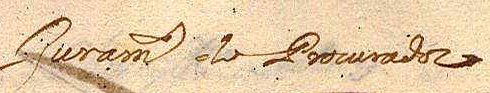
Juramto do Procurador
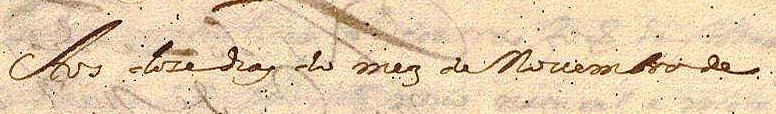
Aos doze dias do mez de Nouembro de
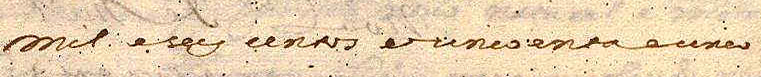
mil e seiscentos e cincoenta e cinco
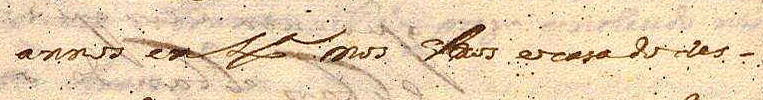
annos em Lxa nos estaos e casa do des
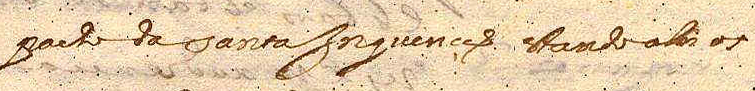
pacho da santa Jnquisiçaõ estando ahi os
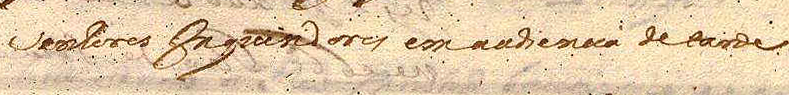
Senhores Jnquisidores em audiencia de tarde
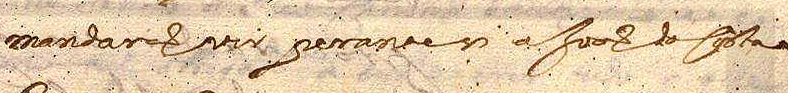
mandaraõ vir perante si a Joaõ da Costa
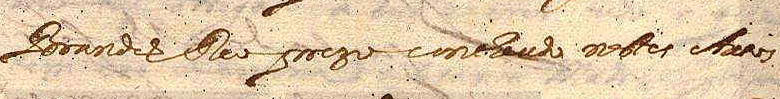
Brandaõ Reo prezo contheudo nestes Autos
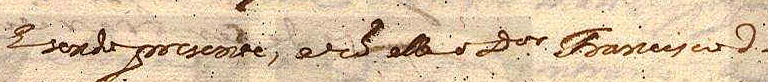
E sendo presente, e cō elle o D.or Francisco de
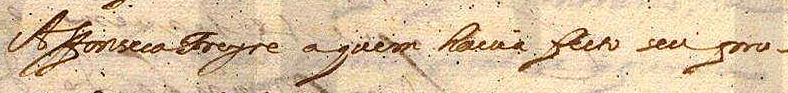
Affonseca Freyre a quem hauia feito seu pro
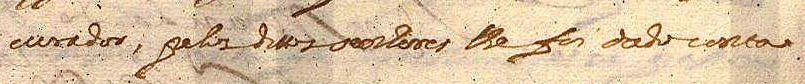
curador, pelos dittos senhores lhe foi dado conta
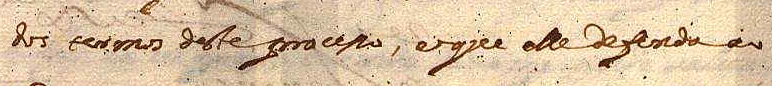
dos termos deste processo, e que elle defenda ao
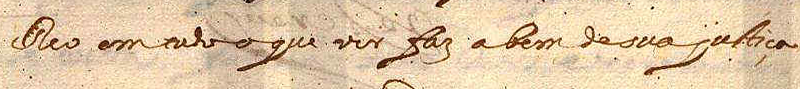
Reo em tudo o que vir faz a bem de sua justiça
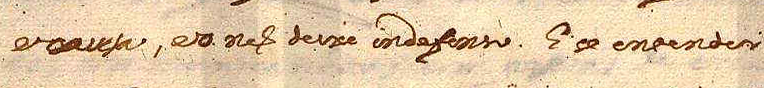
e causa, e o naõ deixe indefenso. E se entender
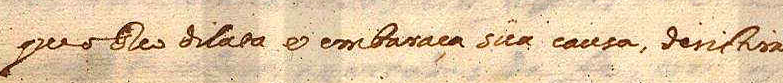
que o Reo dilata e embaraça sua causa, desistira
